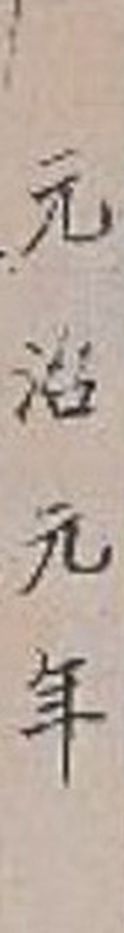元治元年
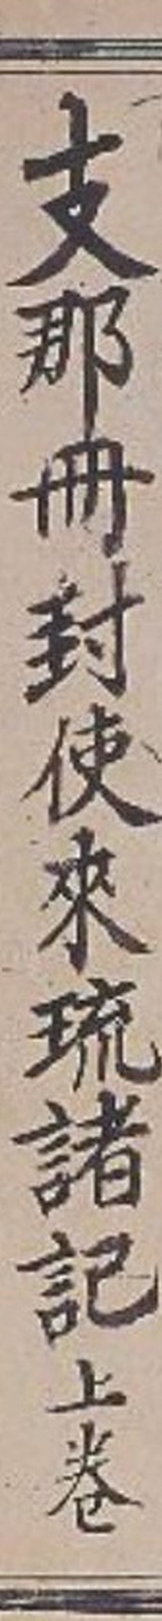支那冊封使来琉諸記上巻

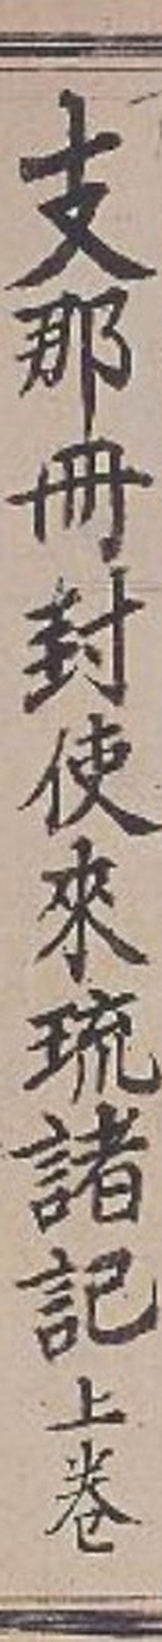志那冊封使来琉諸記上巻

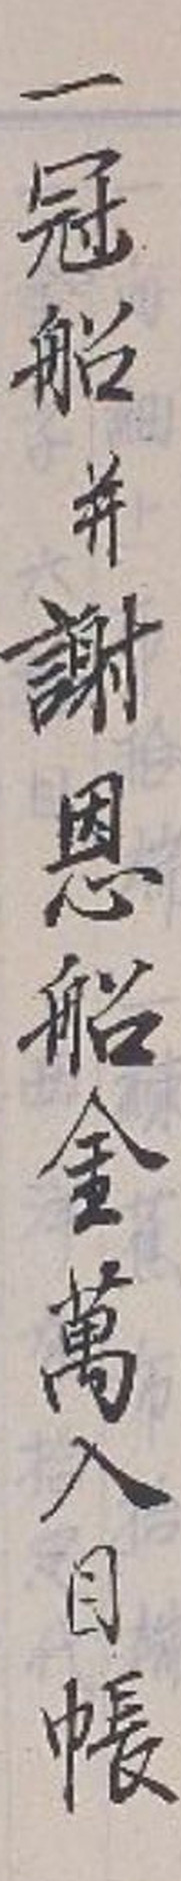一冠船并謝恩船金萬入目帳
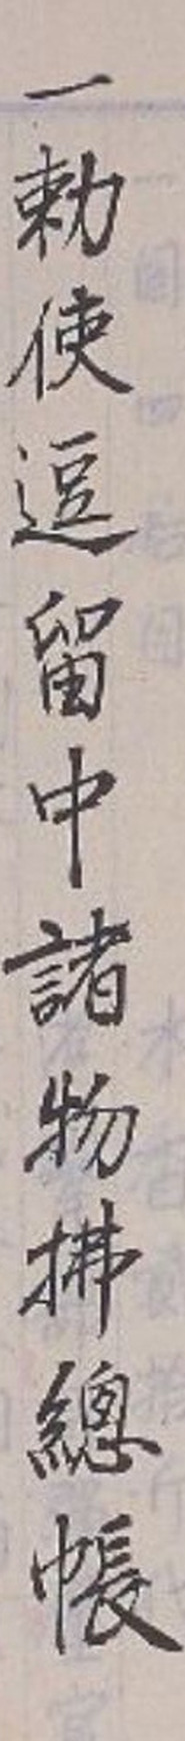一勅使逗留中諸物払總帳
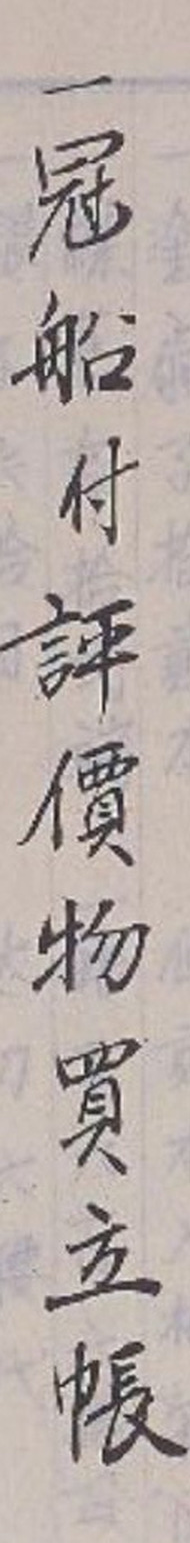一冠船付評価物買立帳
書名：支那冊封使来琉諸記 上巻
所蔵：University of the Ryukyus Library
